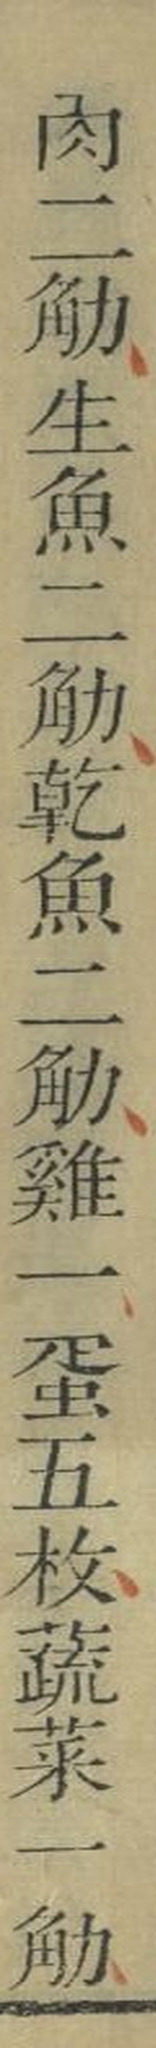肉二觔生魚二觔乾魚二觔雞一蛋五枚蔬菜一觔
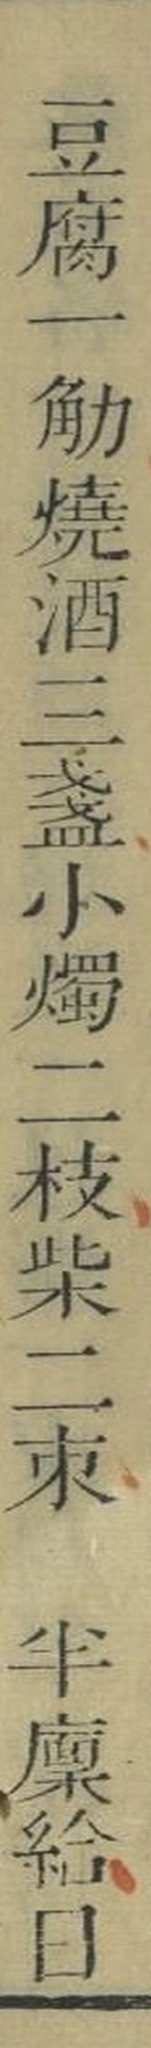豆腐一觔燒酒三盞小燭二枝柴二束半廩給日
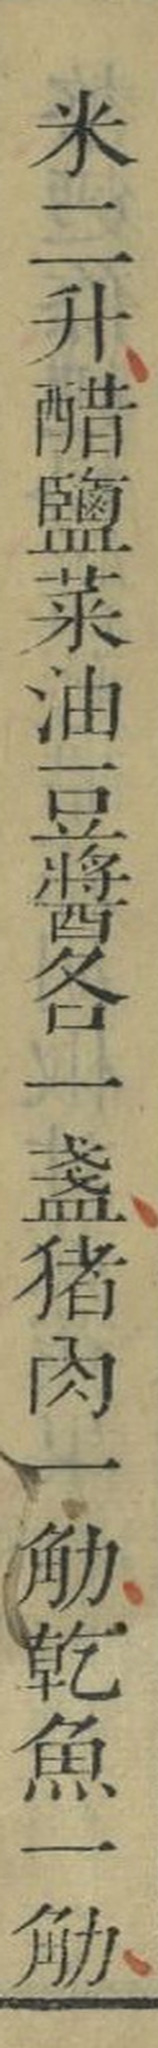米二升醋鹽菜油豆醬各一盞猪肉一觔乾魚一觔
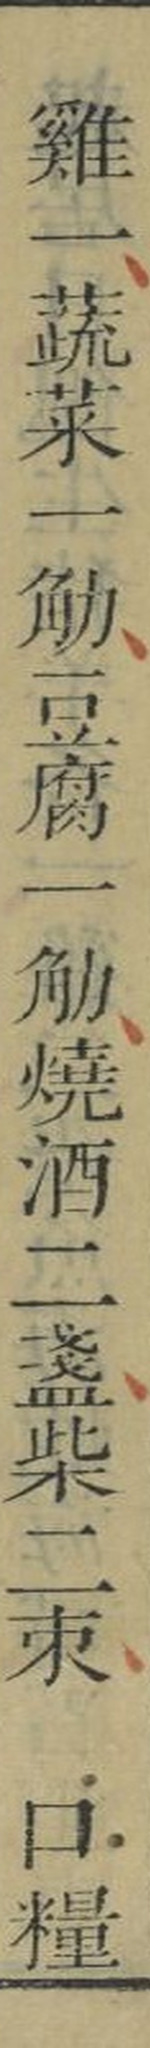雞一蔬菜一觔豆腐一觔燒酒二盞柴二束口糧
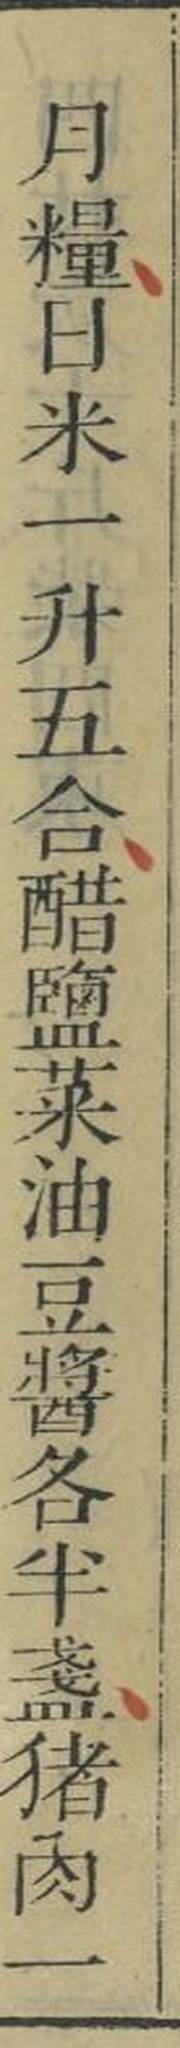月糧日米一升五合醋鹽菜油豆醬各半盞猪肉一
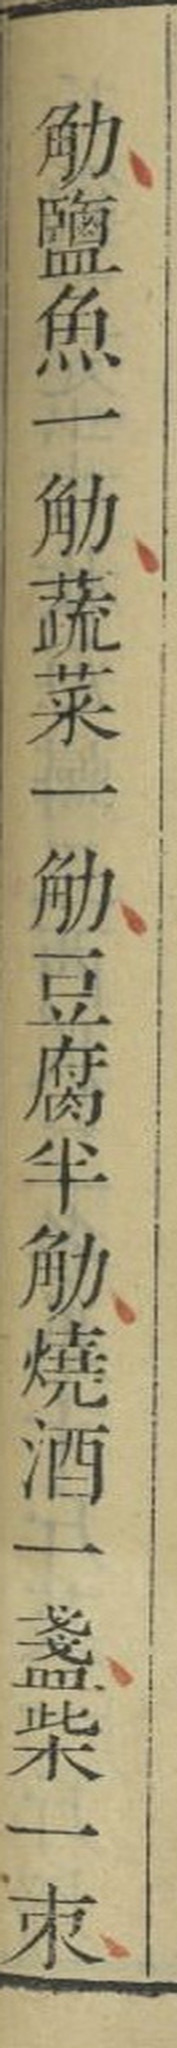觔鹽魚一觔蔬菜一觔豆腐半觔燒酒一盞柴一束
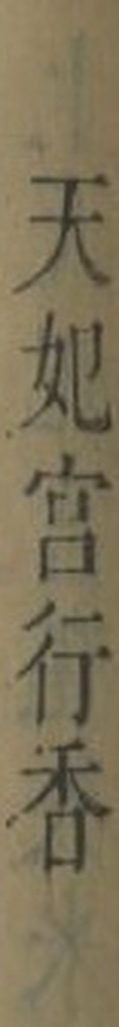天妃宫行香
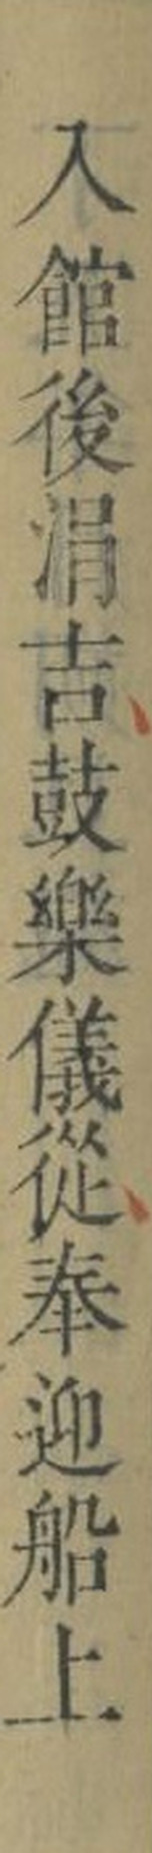入館後涓吉鼓樂儀從奉迎船上
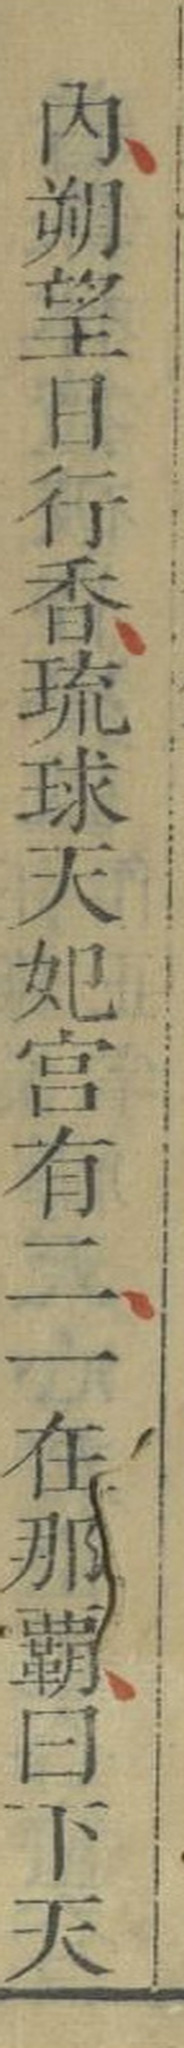内朔望日行香琉球天妃宫有二一在那覇曰下天
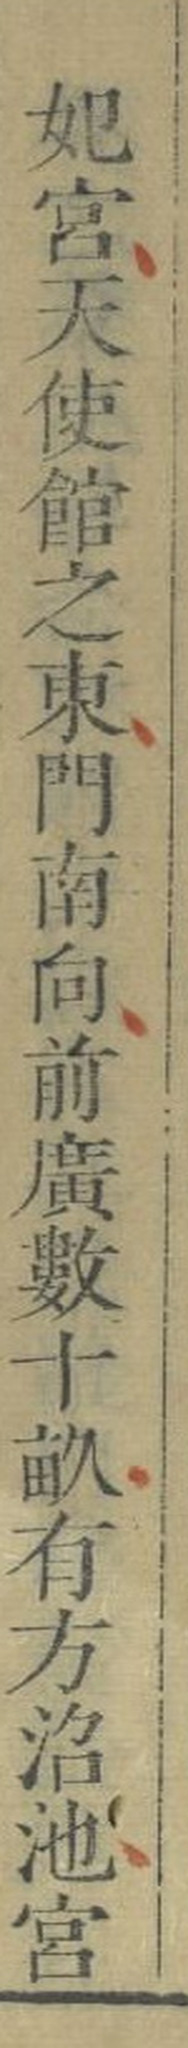妃宮天使館之東門南向前廣數十畝有方沼池宮
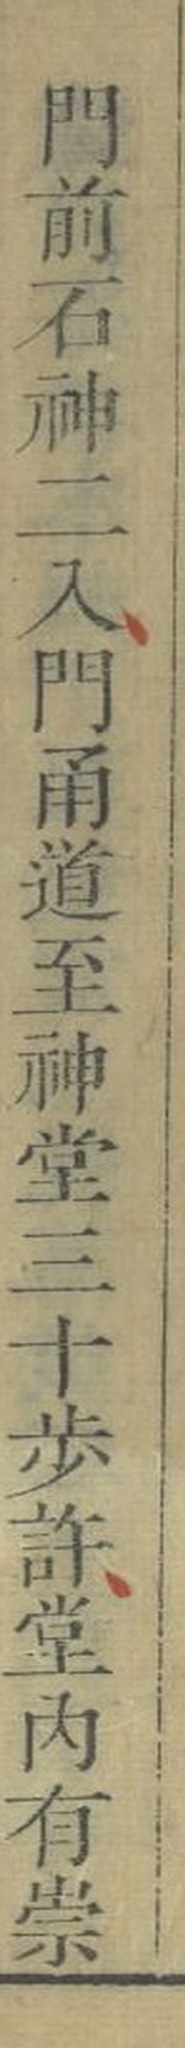門前石神二入門甬道至神堂三十歩許堂内有崇
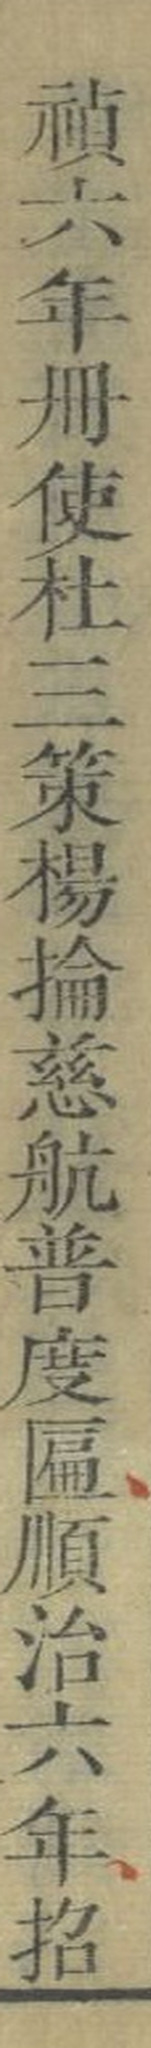禎六年冊使杜三策楊掄慈航普度匾順治六年招
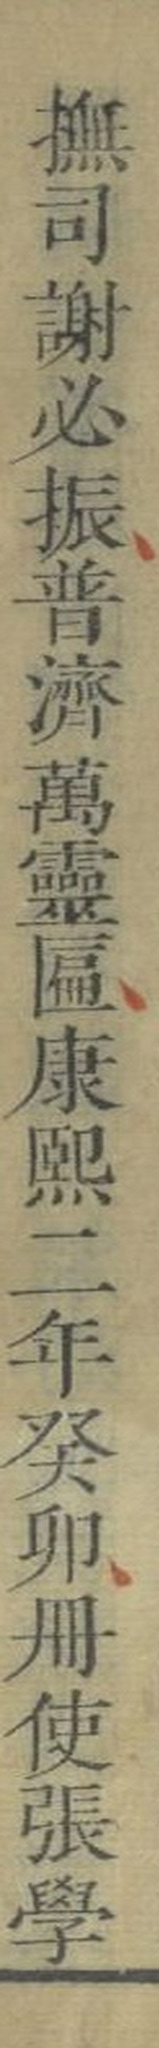撫司謝必振普濟萬靈匾康煕二年癸卯冊使張學
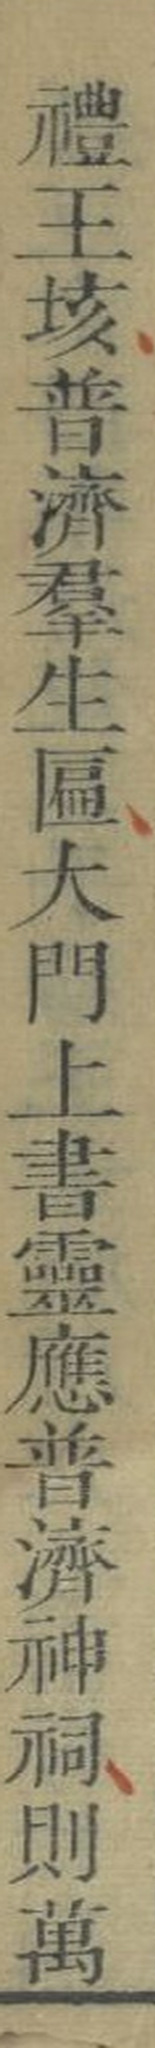禮王垓普濟羣生匾大門上書靈應普濟神祠則萬

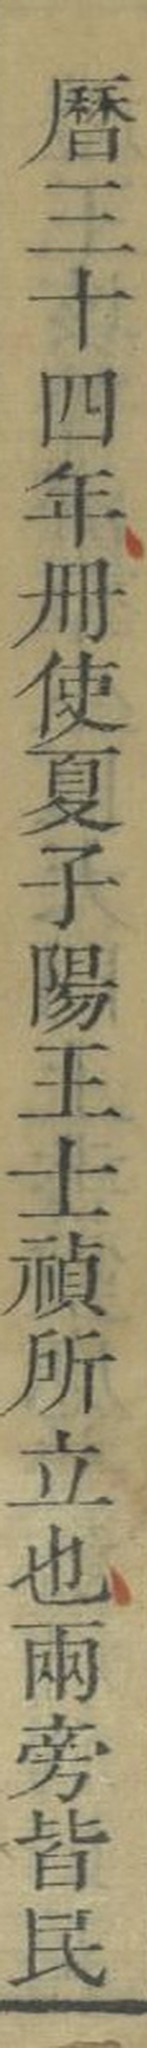曆三十四年冊使夏子陽王士禎所立也兩旁皆民
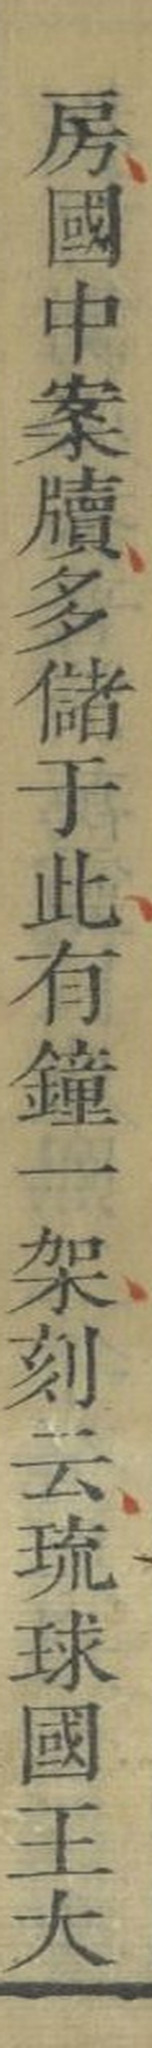房國中案牘多儲于此有鐘一架刻云琉球國王大
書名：中山伝信録 巻一、巻二
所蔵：University of the Ryukyus Library
